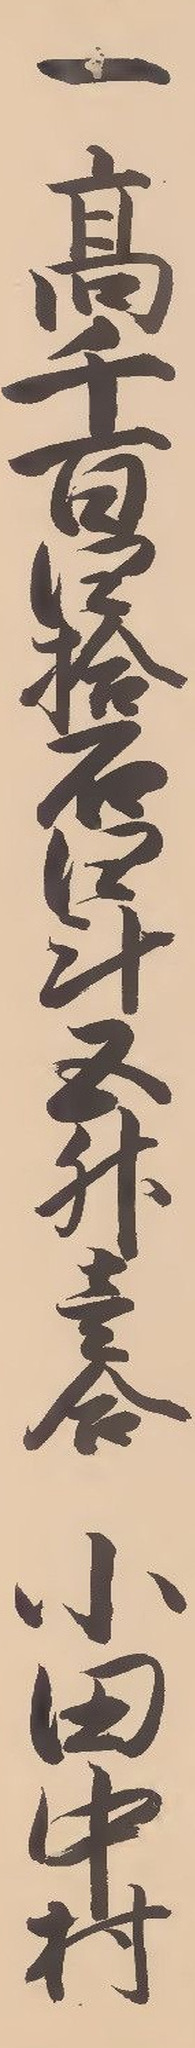一高千百四拾石四斗五升壱合小田中村
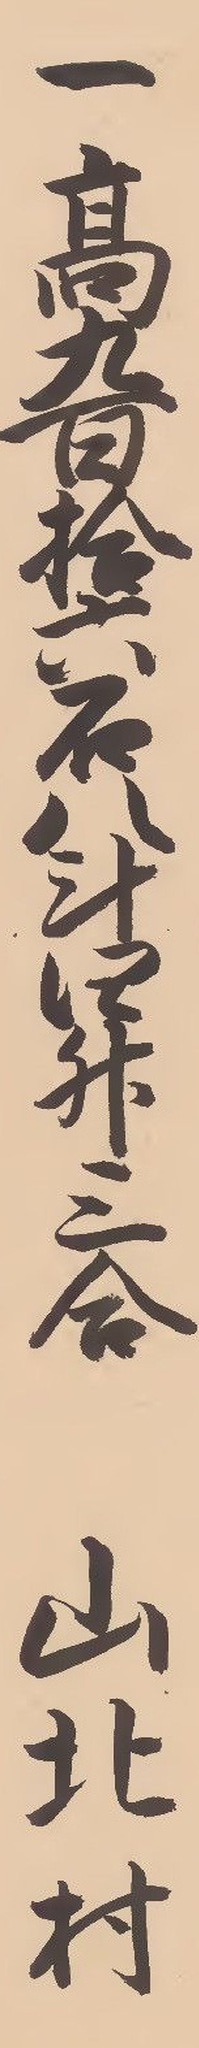一高九百拾六石八斗四升三合山北村
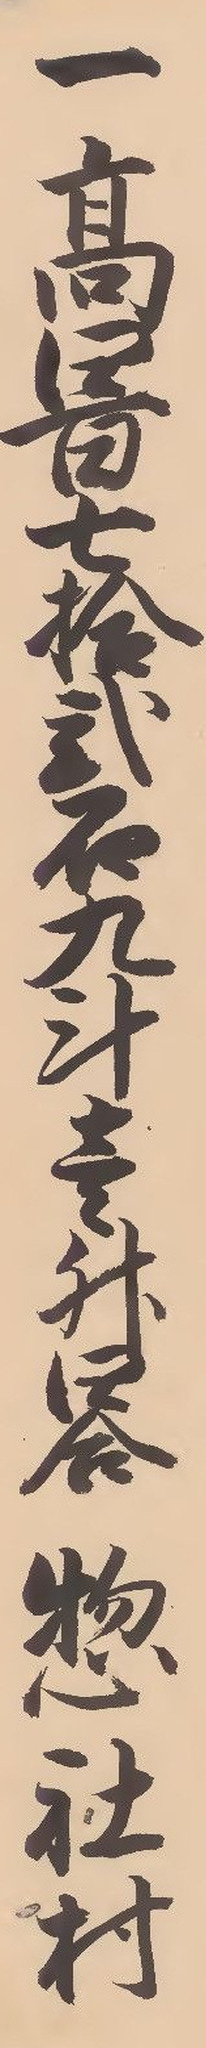一高四百七拾弐石九斗壱升四合惣社村

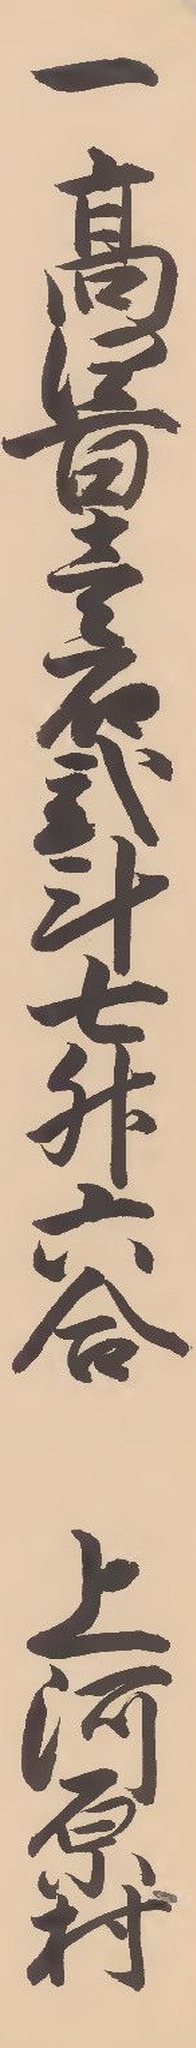一高四百壱石弐斗七升六合上河原村
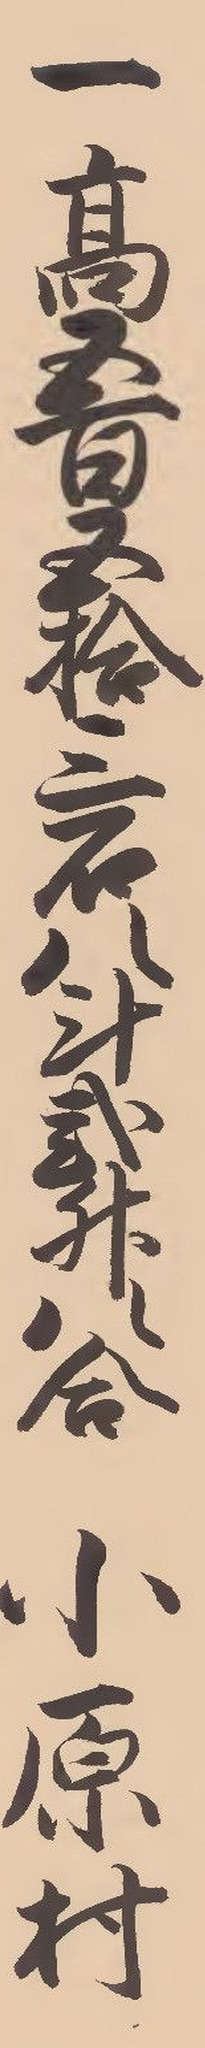一高五百五拾三石八斗弐升八合小原村
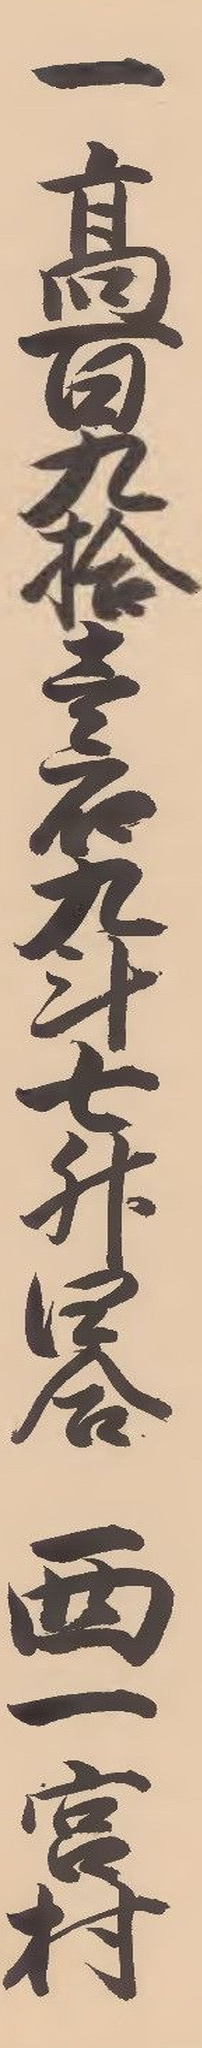一高百九拾壱石九斗七升四合西一宮村
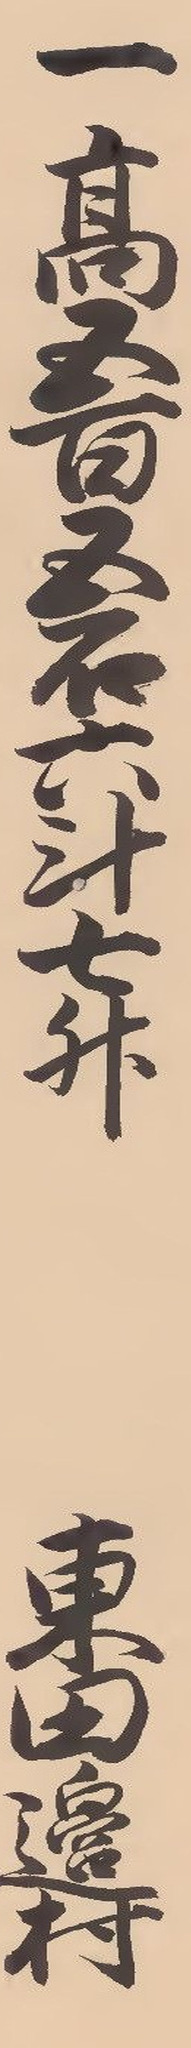一高五百五石六斗七升東田辺村
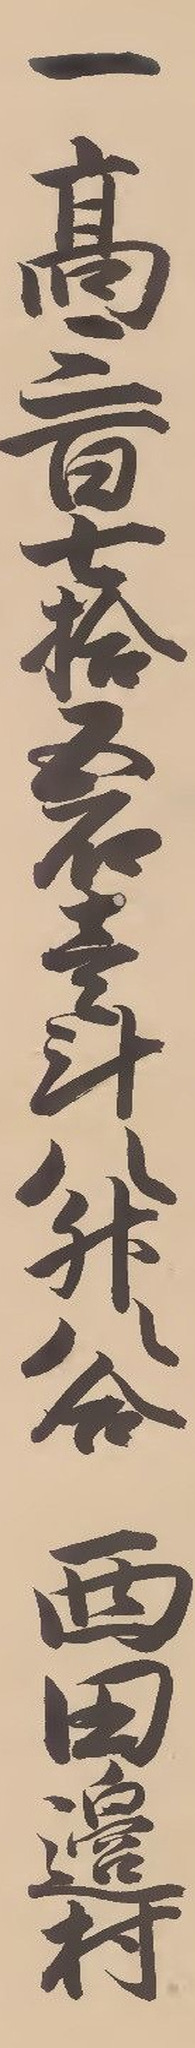一高三百七拾五石壱斗八升八合西田辺村
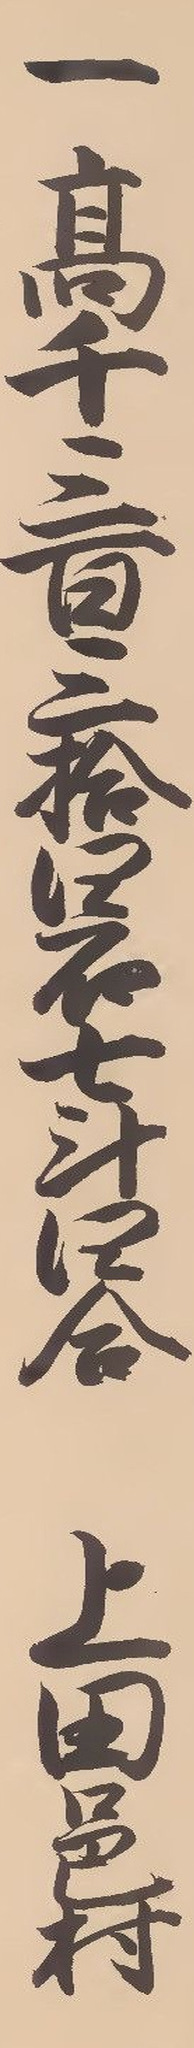一高千三百三拾四石七斗四合上田邑村
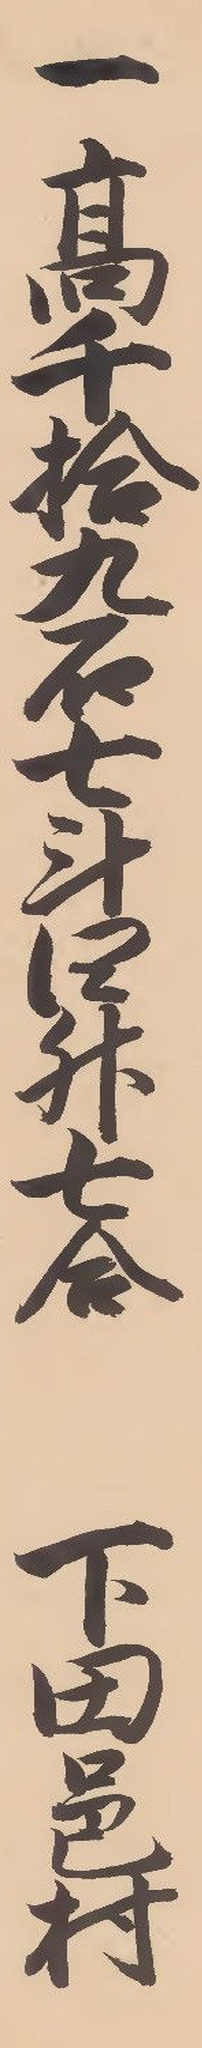一高千拾九石七斗四升七合下田邑村
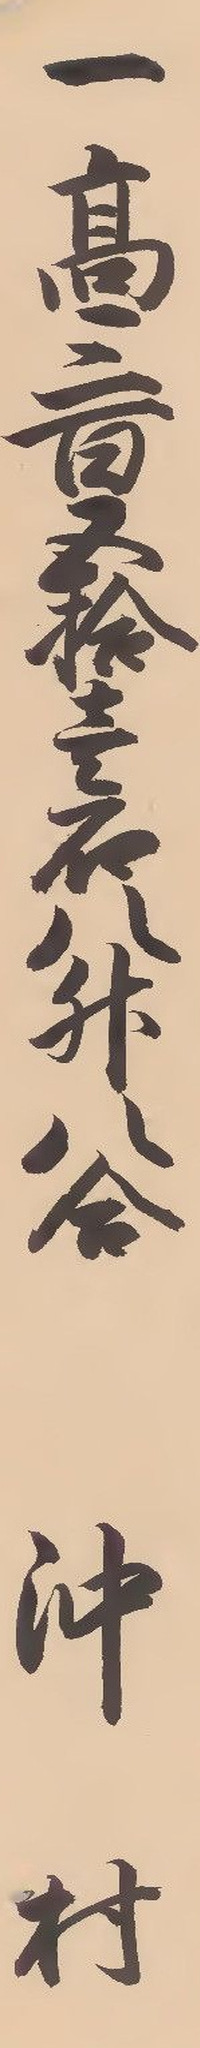一高三百五拾壱石八升八合沖村

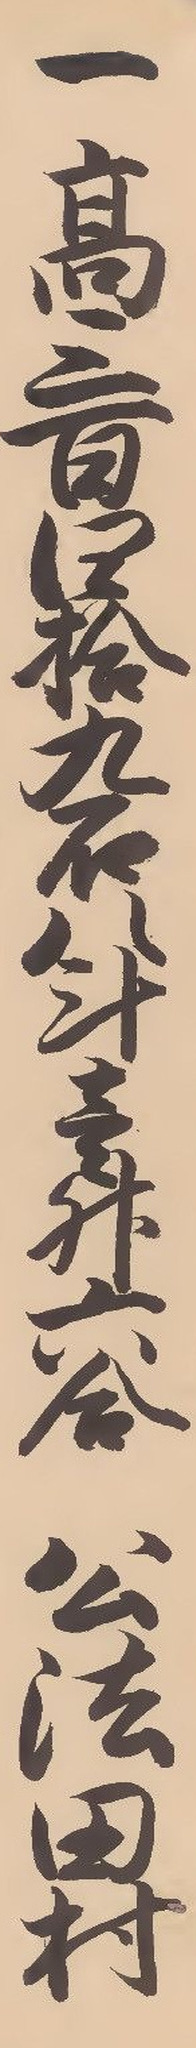一高三百四拾九石八斗壱升六合公法田村
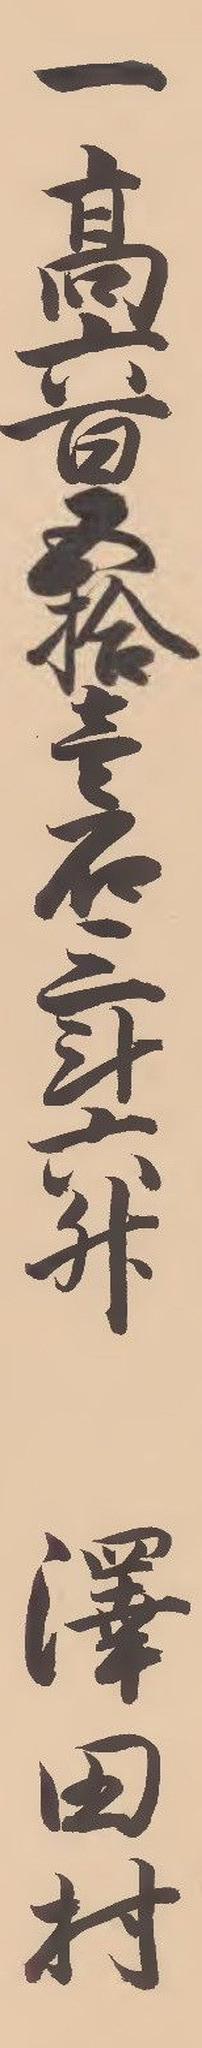一高六百五拾壱石三斗六升沢田村
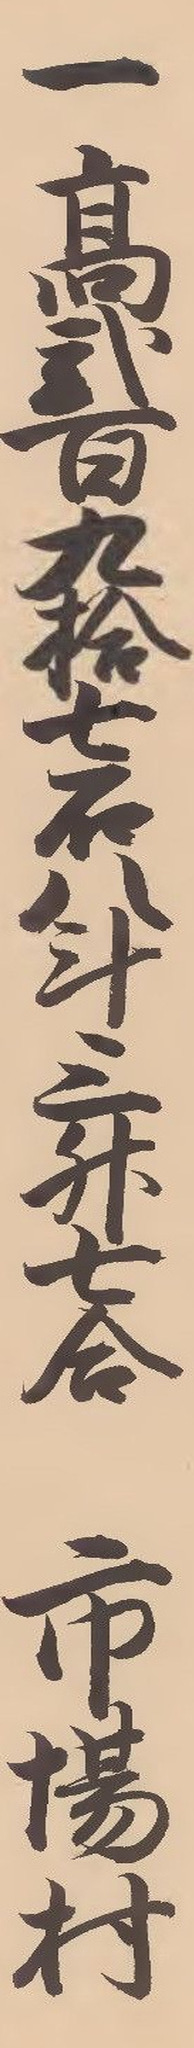一高弐百九拾七石八斗三升七合市場村
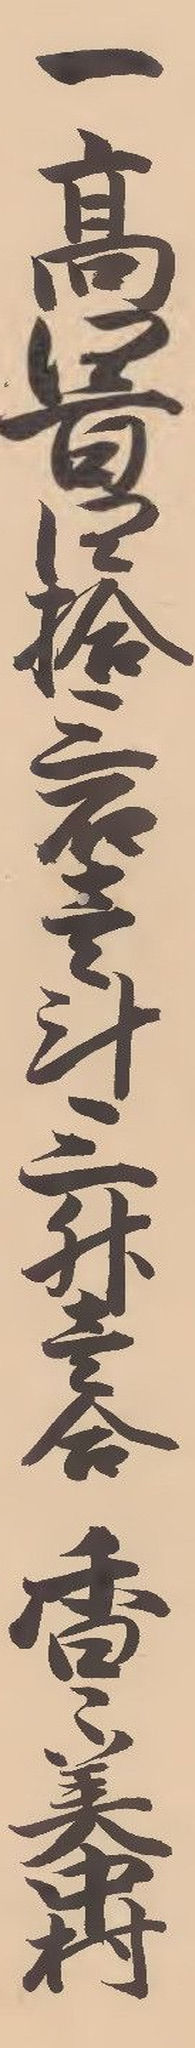一高四百四拾三石壱斗三升壱合香々美中村
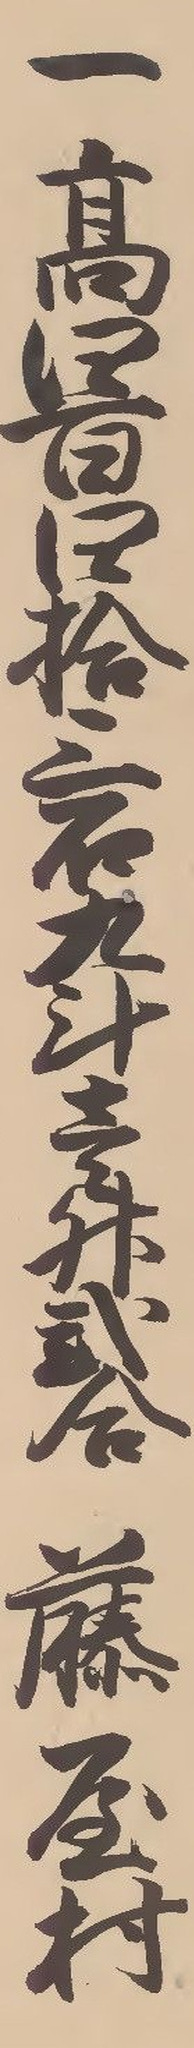一高四百四拾三石九斗壱升弐合藤屋村
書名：美作国郷帳
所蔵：国立公文書館 National Archives of Japan
